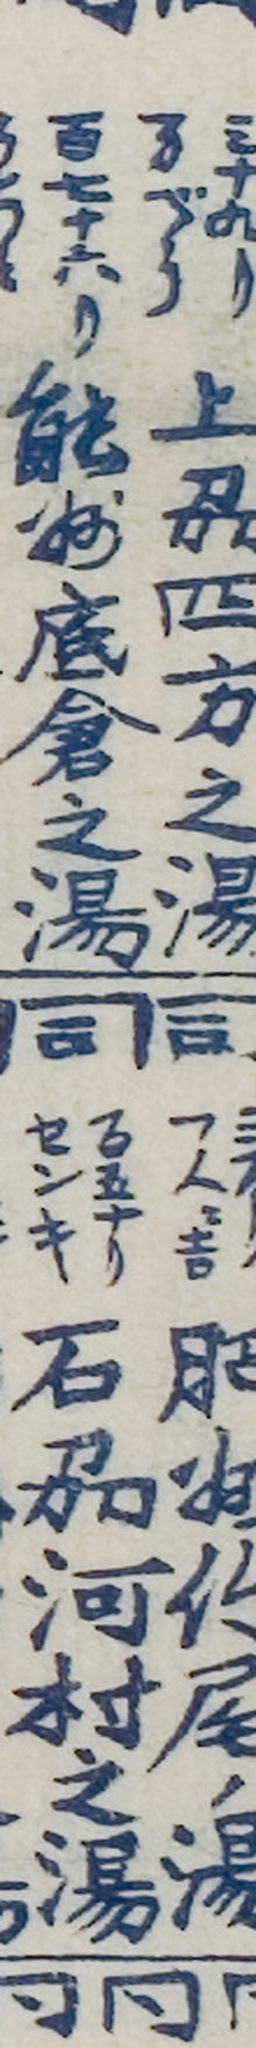同百七十六リ能州底倉之湯
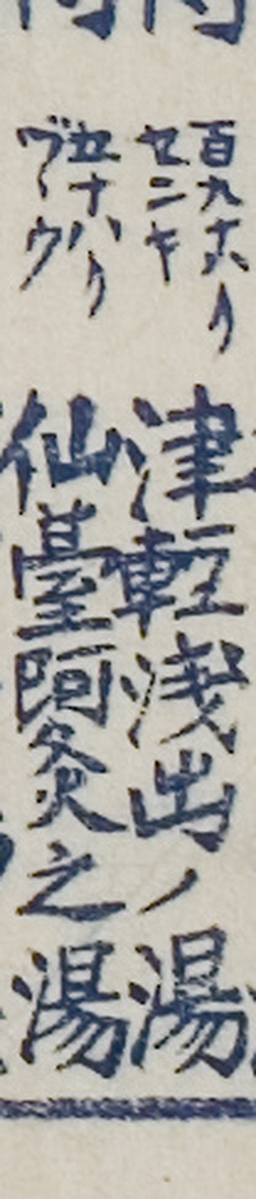同五十八リ仙台阿灸之湯
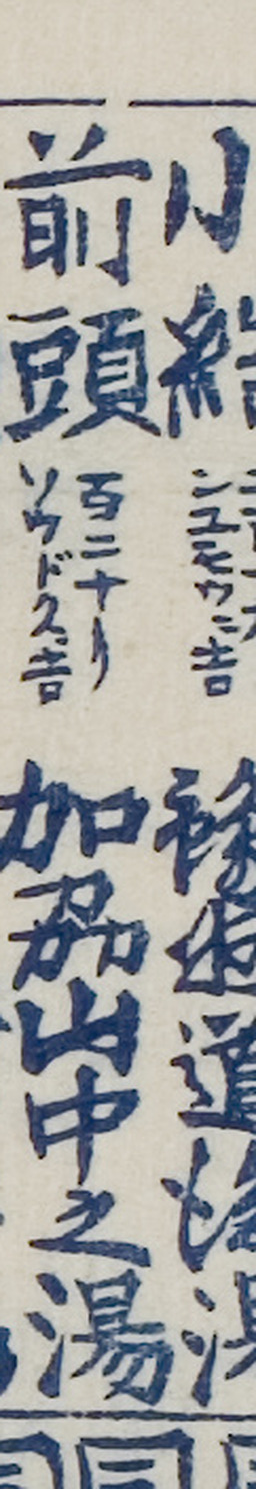前頭百二十リ加州山中之湯
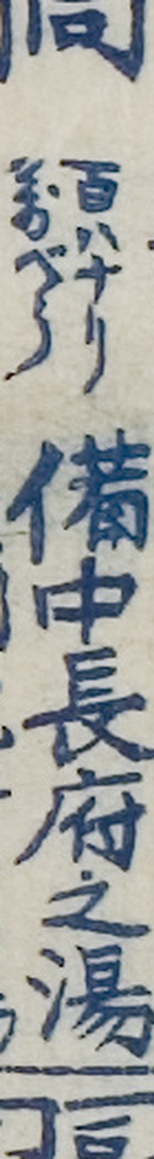同百八十リ備中長府之湯
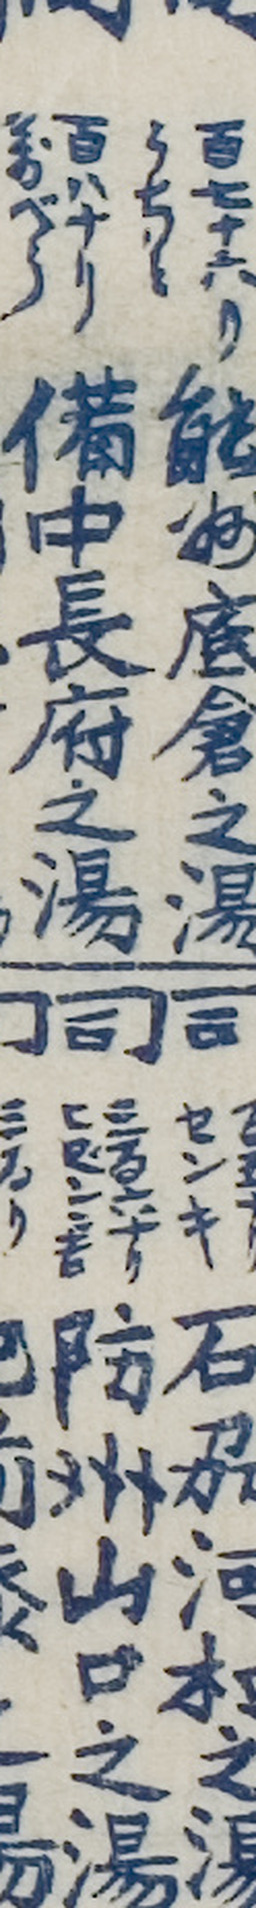同百八十リ備中長府之湯
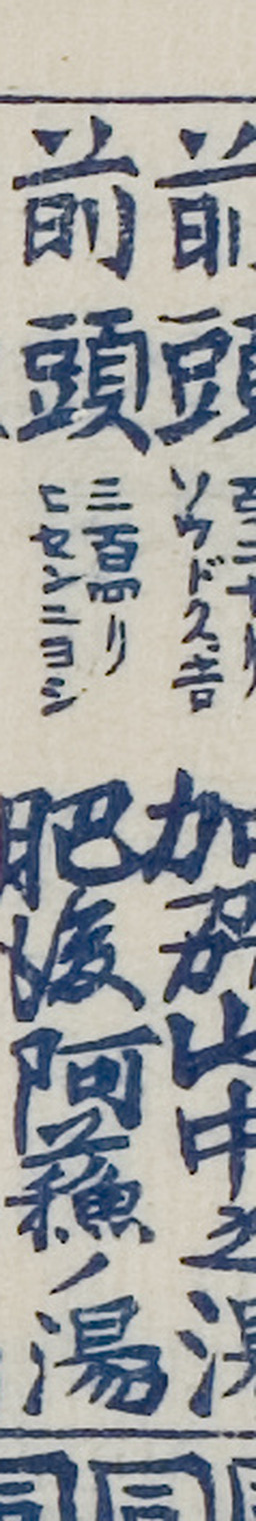前頭三百四リ肥後阿蘇之湯
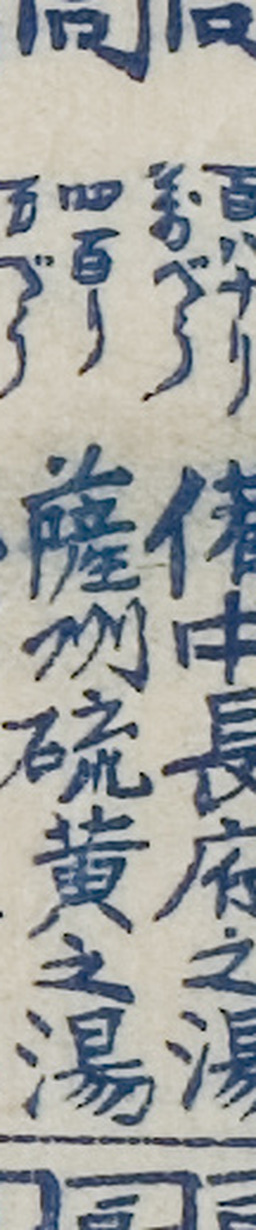同四百リ薩州硫黄之湯
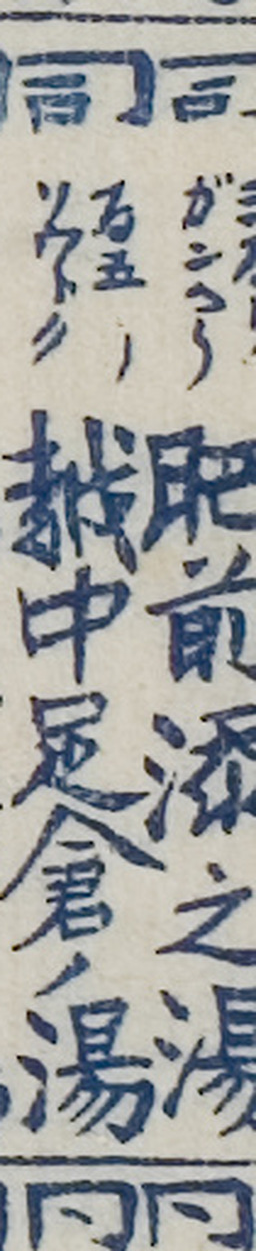同百五十リ越中足倉之湯
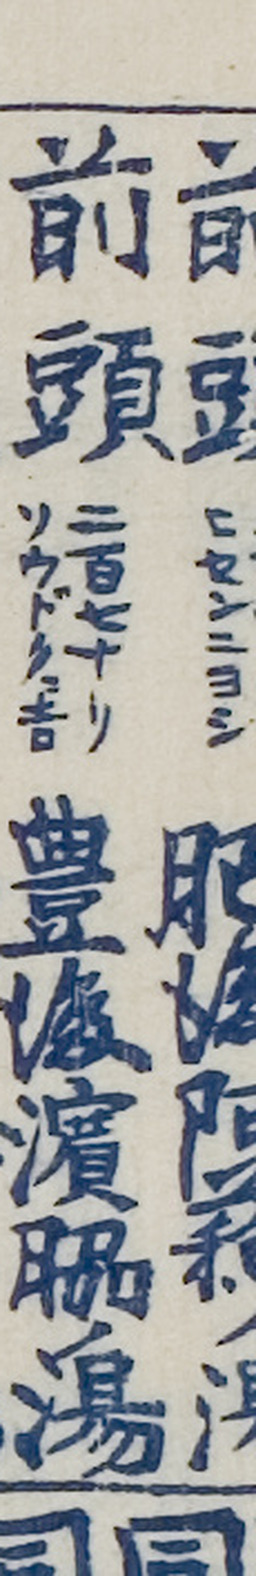前頭二百七十リ豊後浜脇之湯
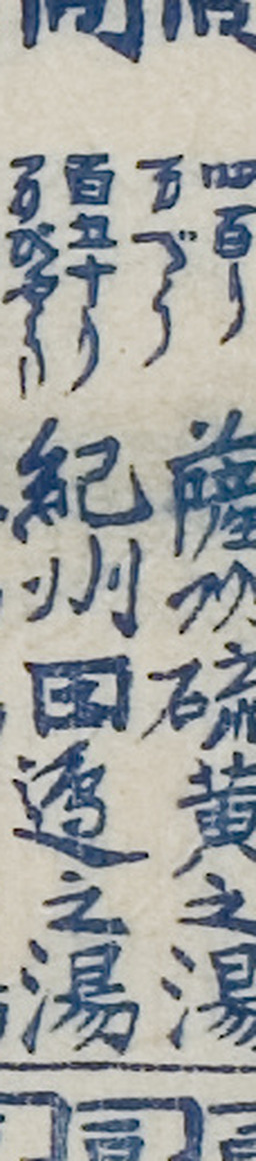同百五十リ紀州田辺之湯
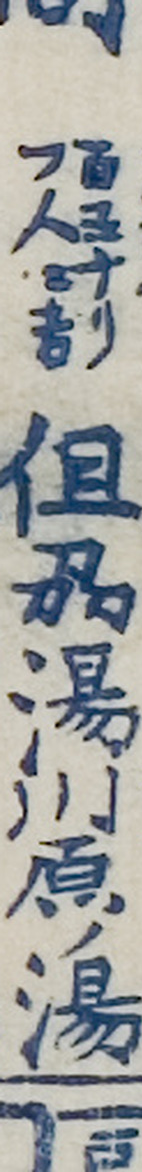同百五十リ但州湯川原之湯
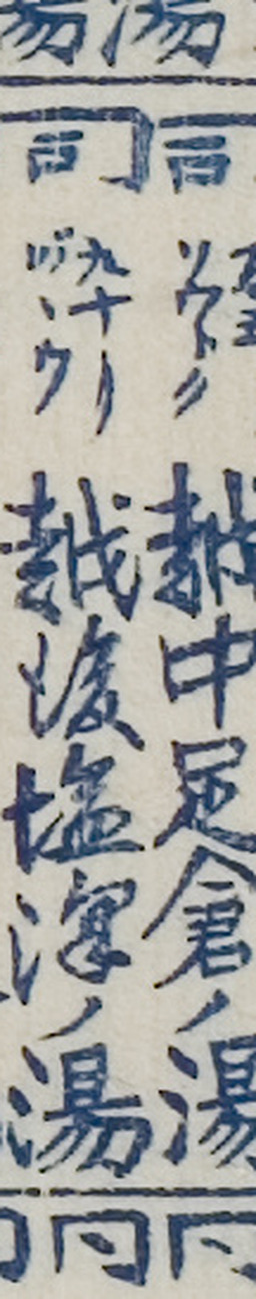同九十リ越後塩沢之湯
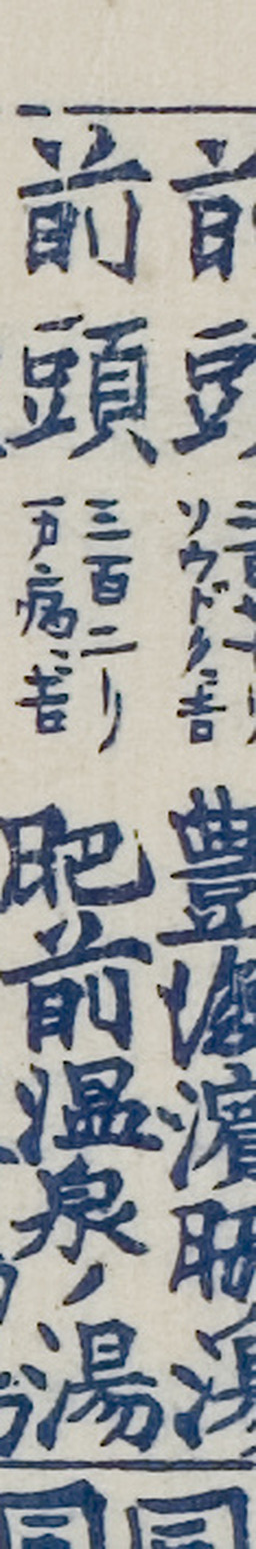前頭三百二リ肥前温泉之湯
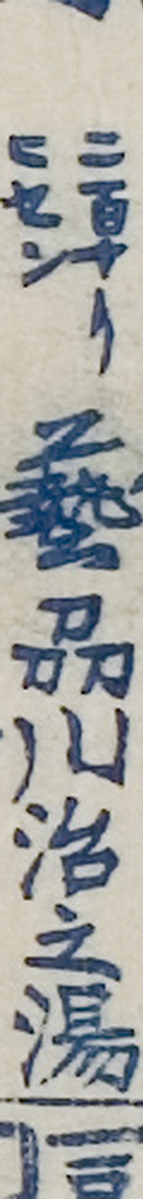同二百十リ芸州川治之湯
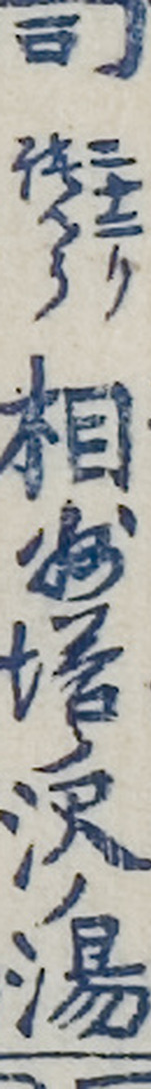同二十二リ相州湯元之湯
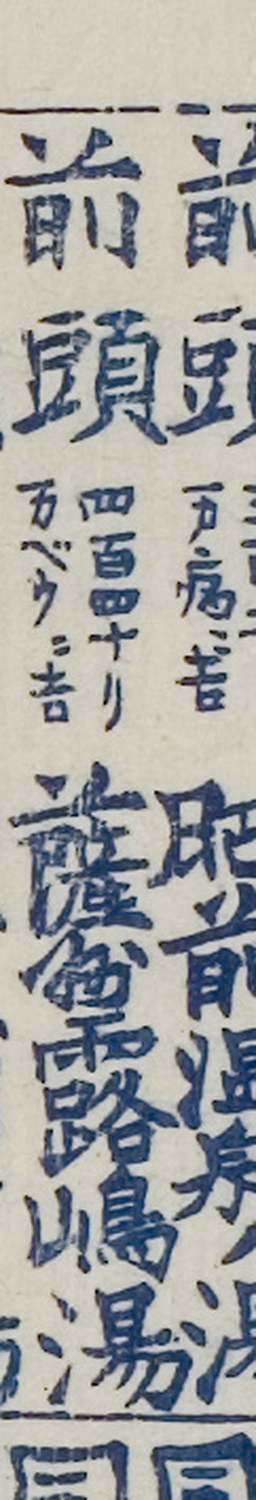前頭四百四十リ薩州霧嶋之湯
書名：諸国温泉一覧
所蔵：東京大学総合図書館 General Library in the University of Tokyo, JAPAN
